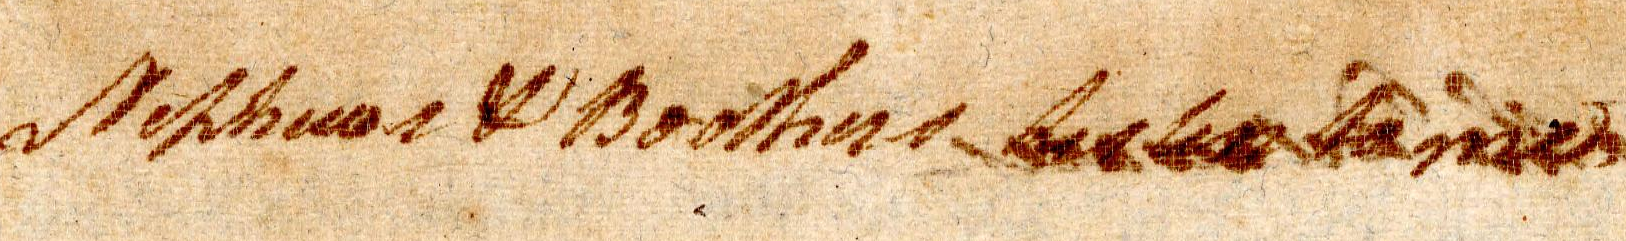Nephews & Brothers Listen to me
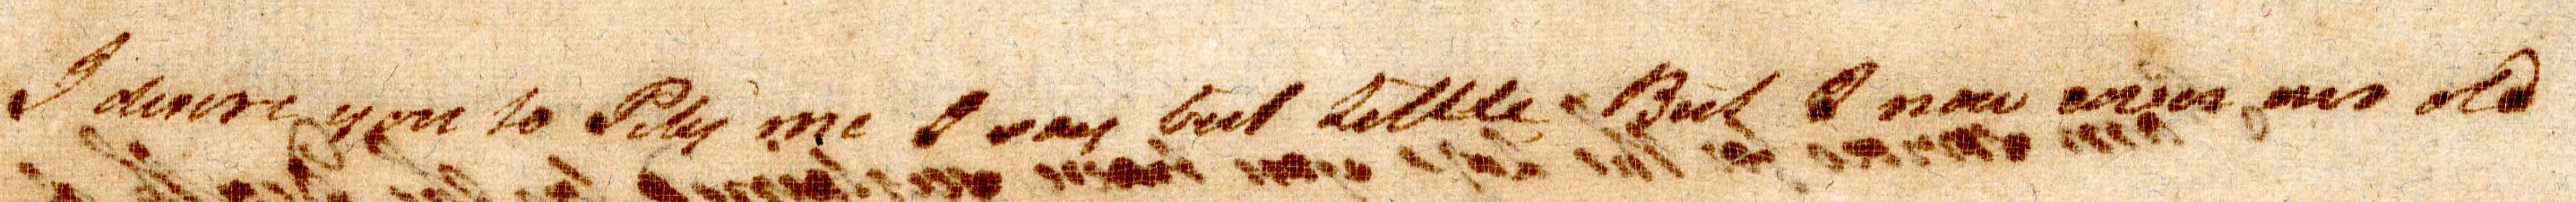I desire you to Pity me I say but Little But I now cover our old
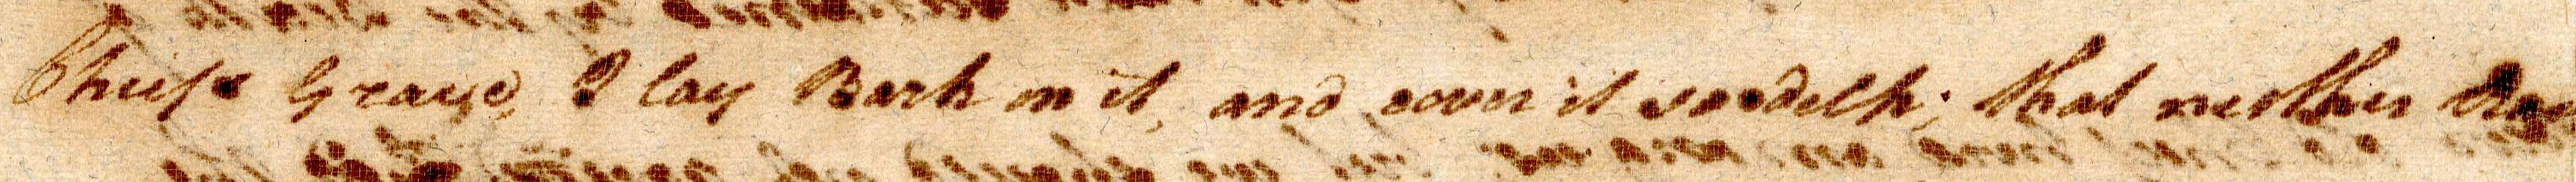Chiefs Grave & lay Bark on it and cover it so deep that neither [__]
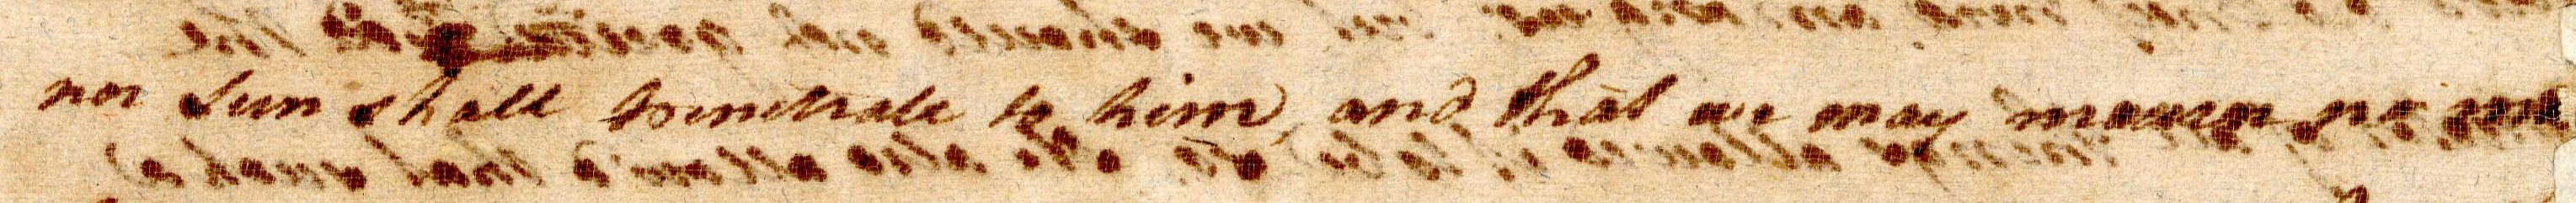nor sun shall penetrate to him, and that we may mourn no m[_]
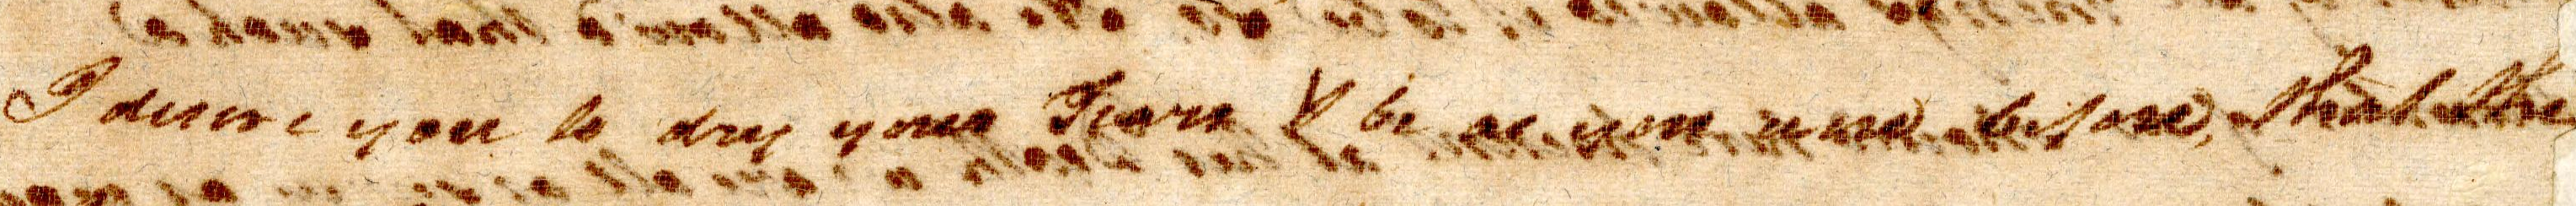I desire you to dry your Tears & be as you were before, that the
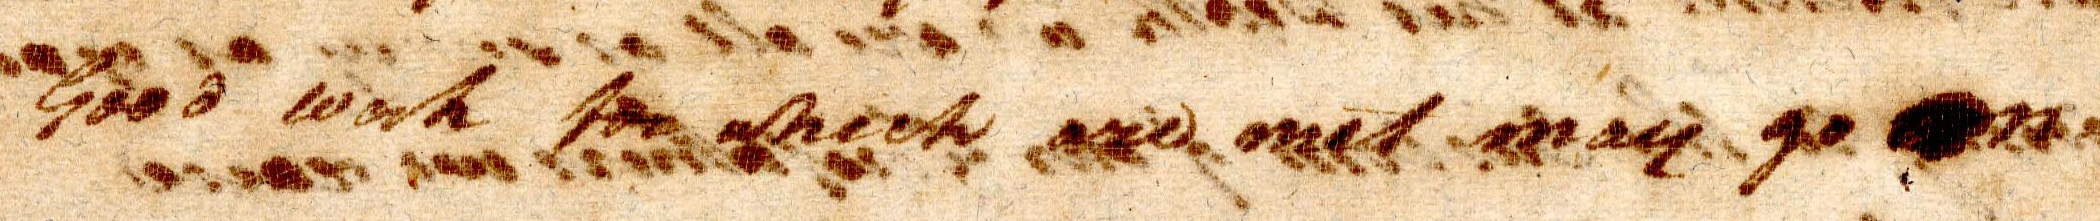Good work for spech are met may go on
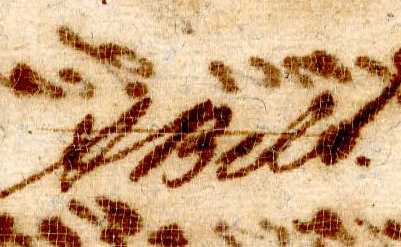A Belt
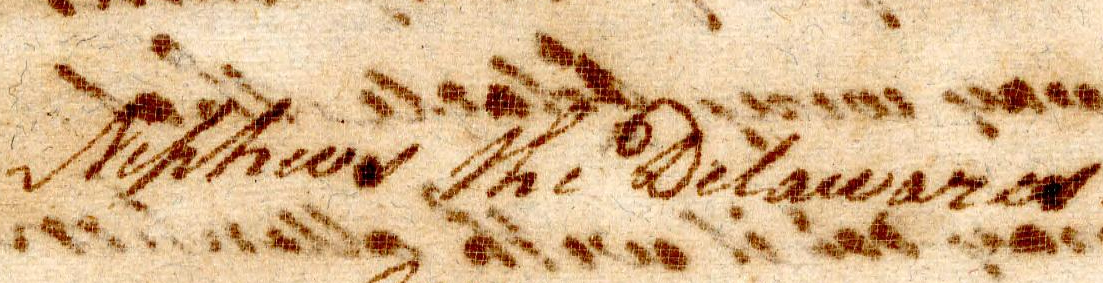Nephews the Delawares
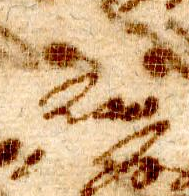now
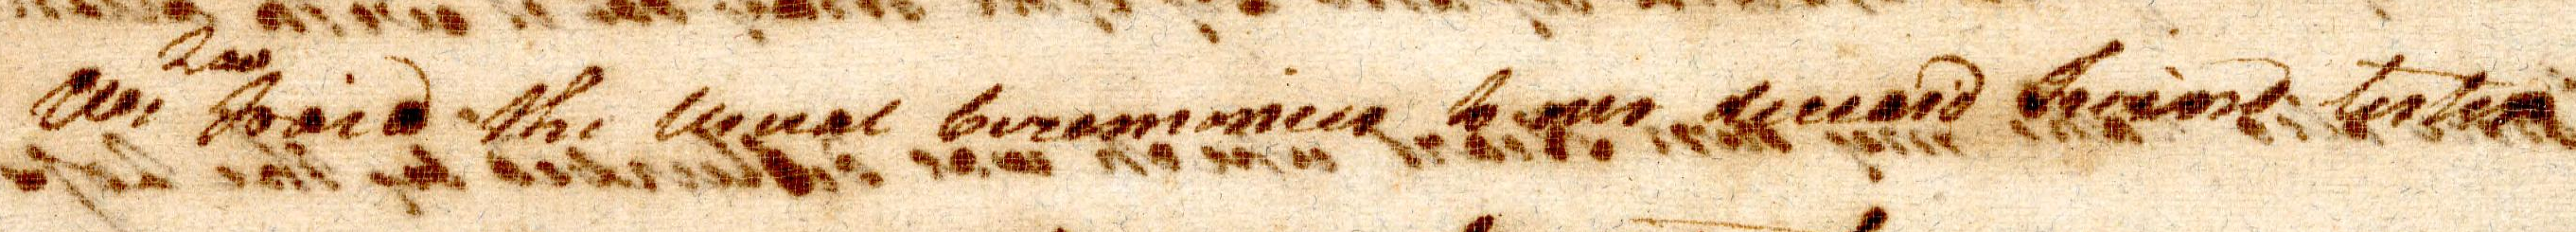We ^ paid the usual Ceremonies to our deceased Friend tested
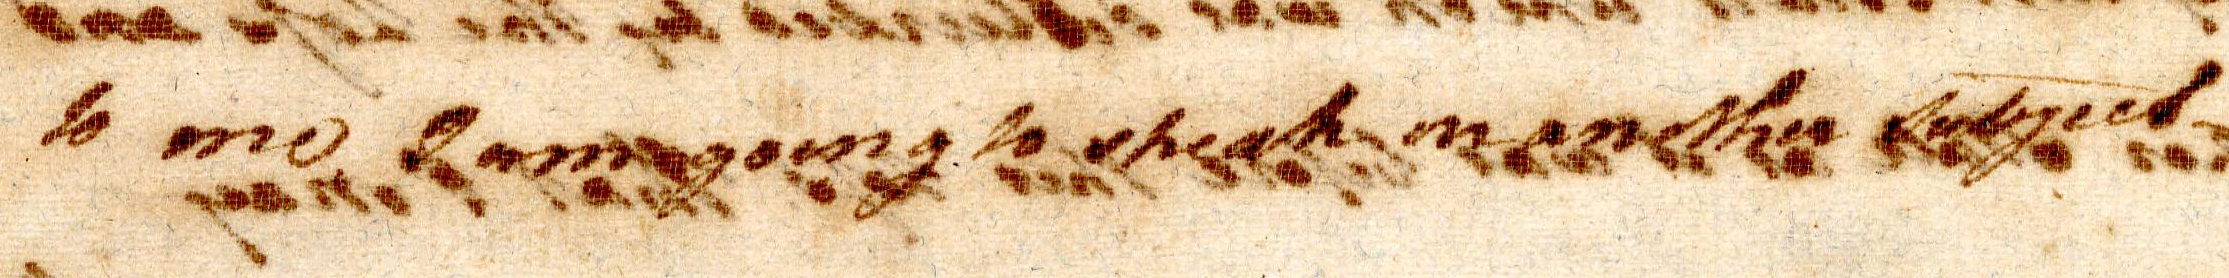to me I am going to speak on another Subject
